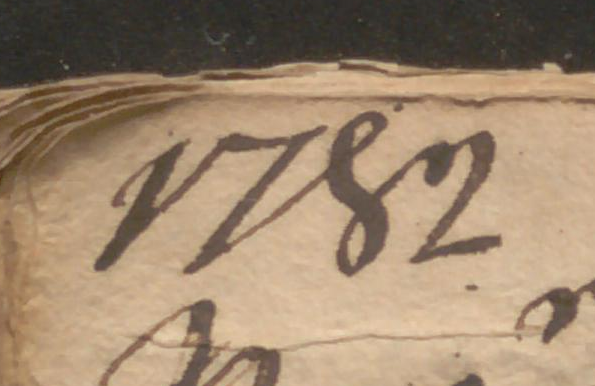1782
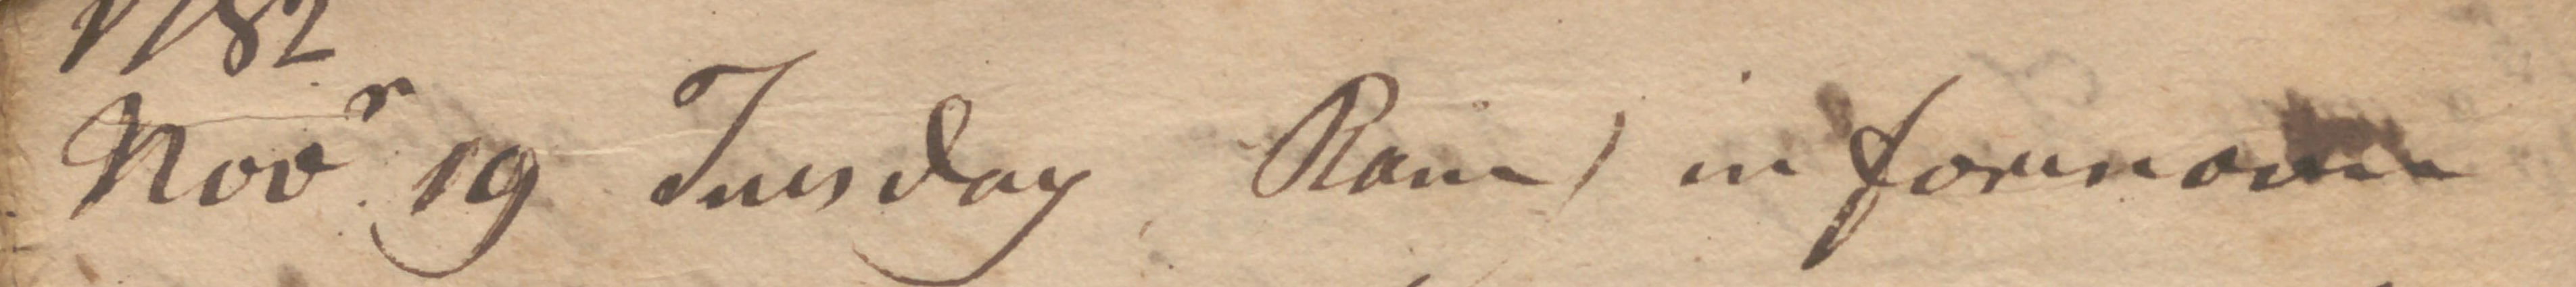Nov^r. 19 Tuesday Rain) in forenoon
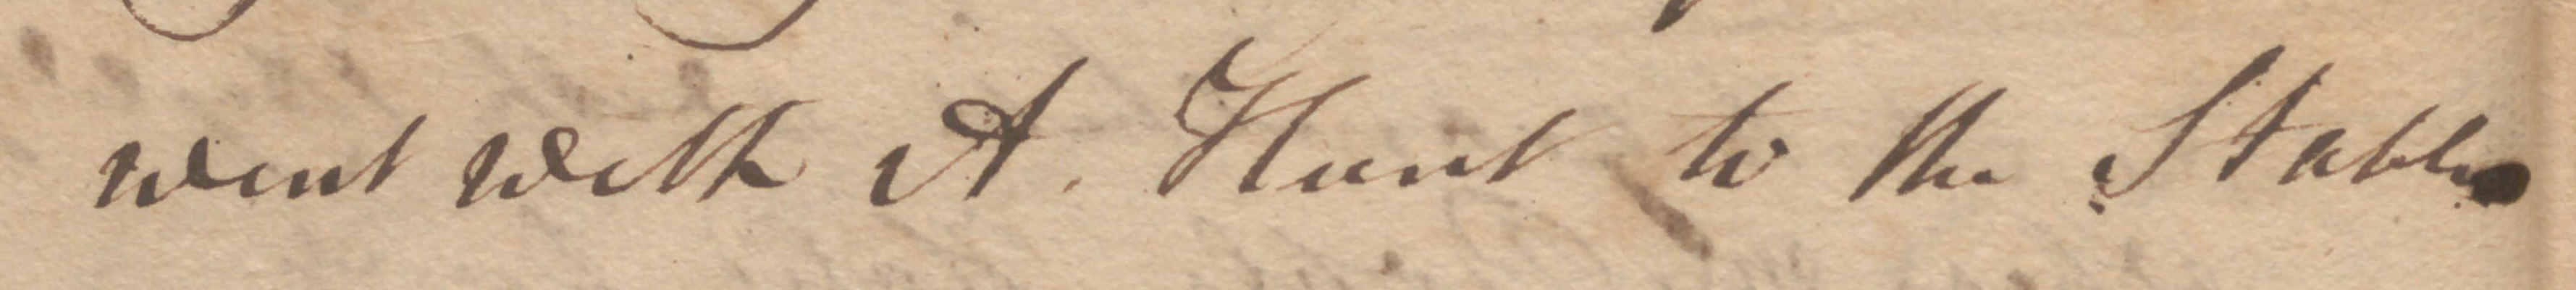went with A. Hunt to the Stable
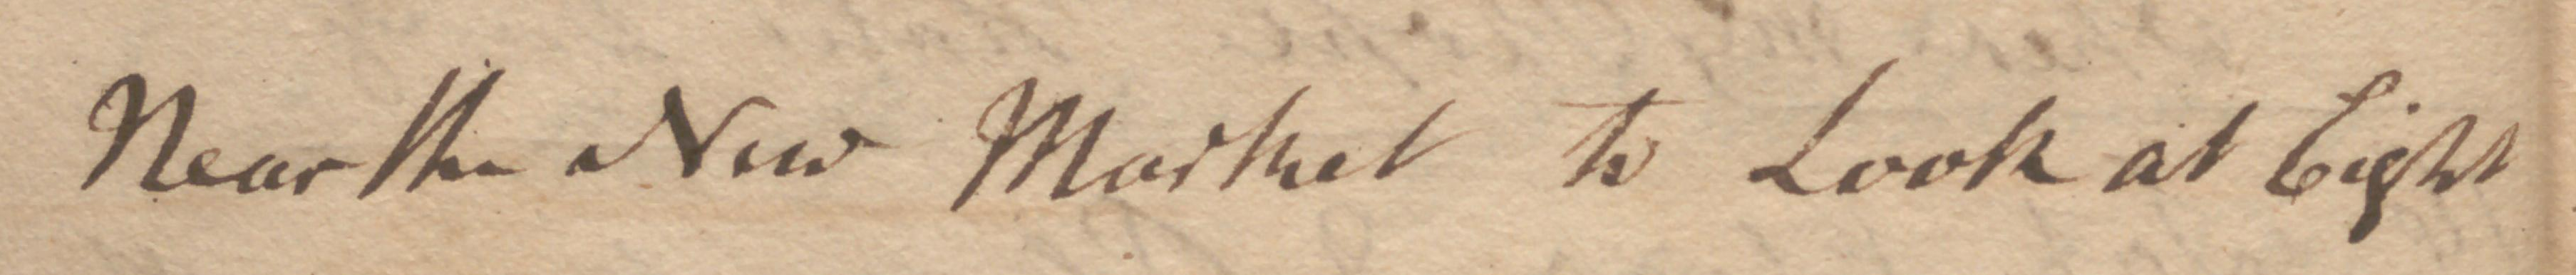Near the New Market to Look at Eight
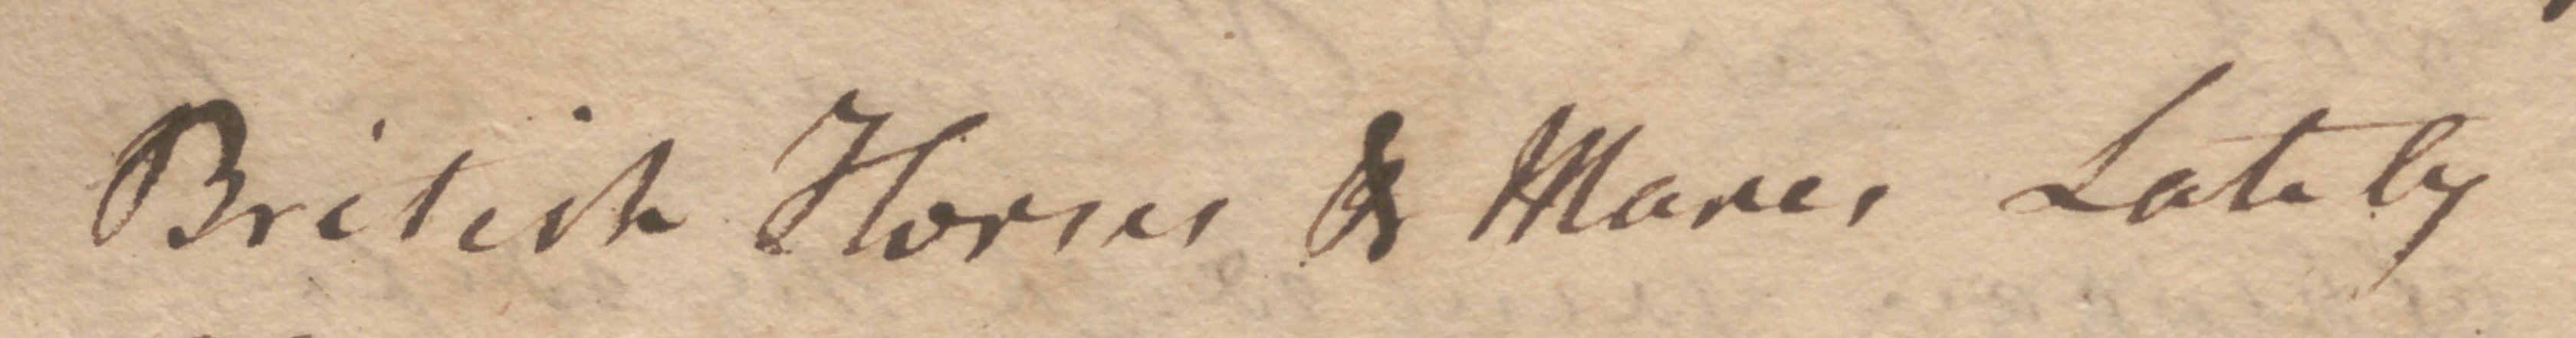British Horses & Mares Lately
